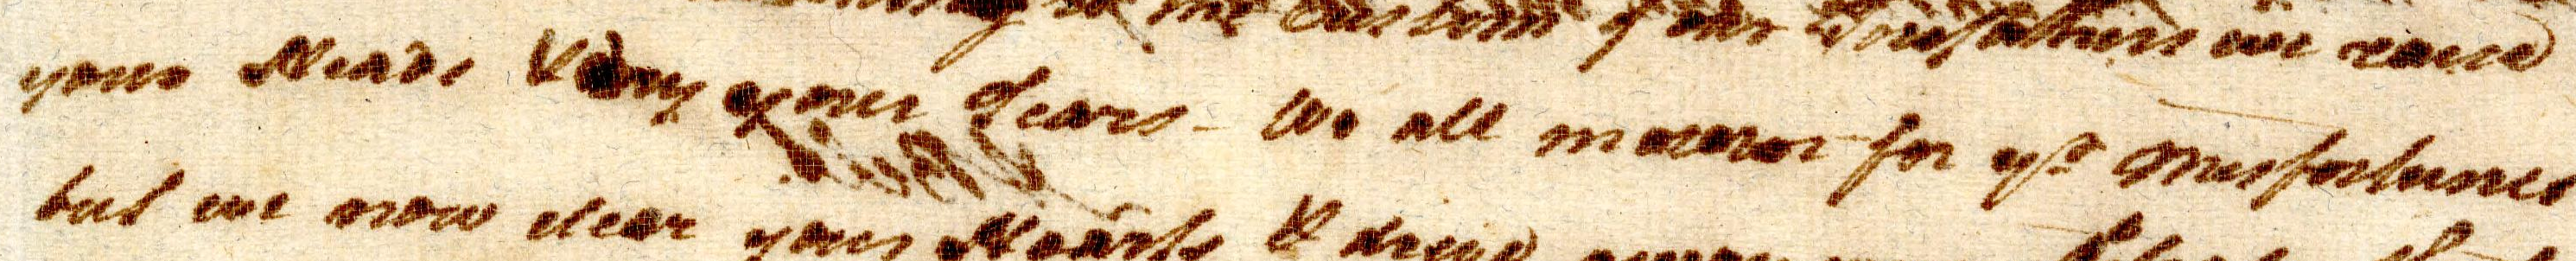your Heads & dry your Tears. We all mourn for y^r. misfortunes
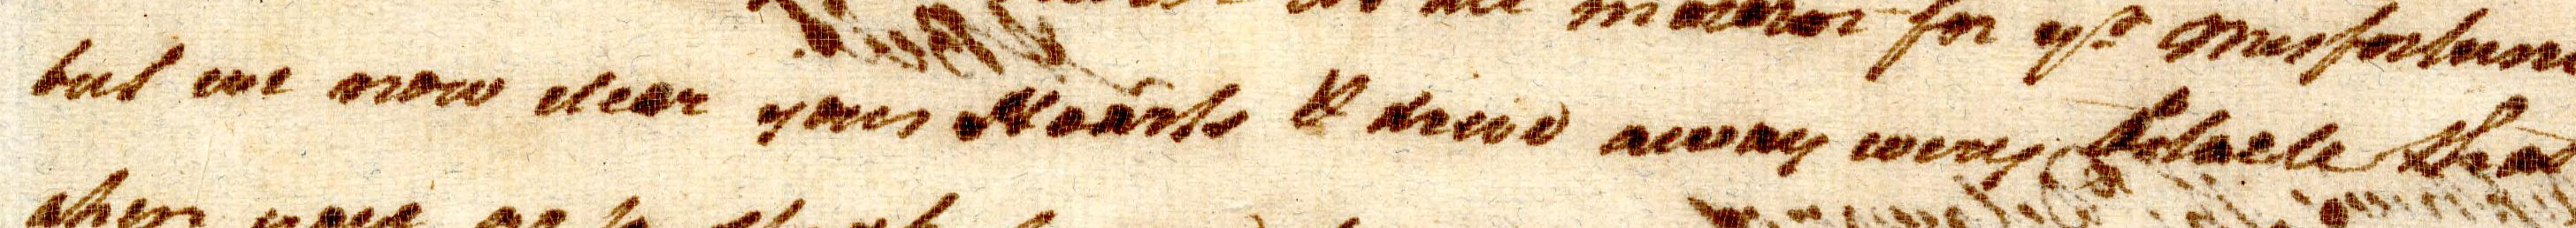but we now clear your Hearts & drive away every obstacle that
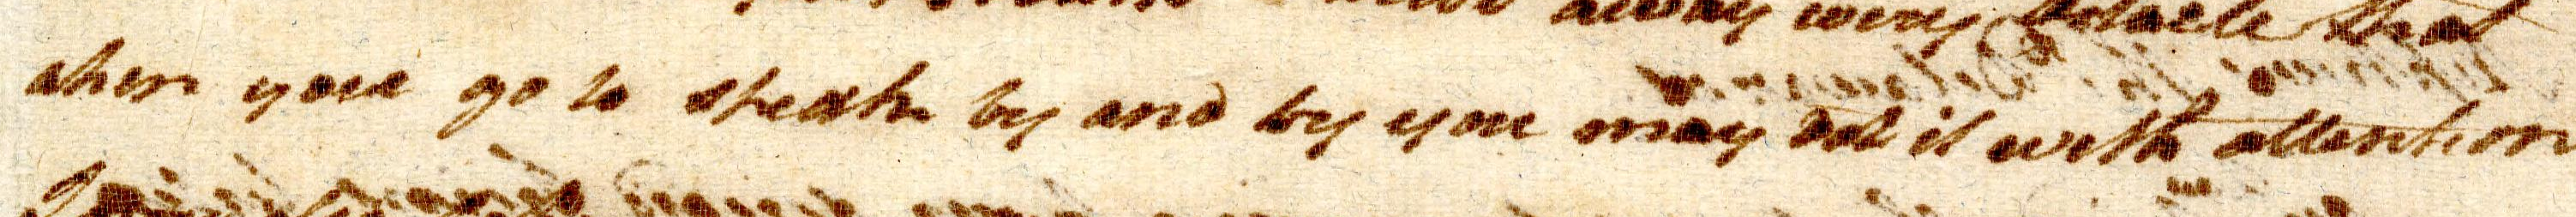when you go to speak by and by you may do it with attention
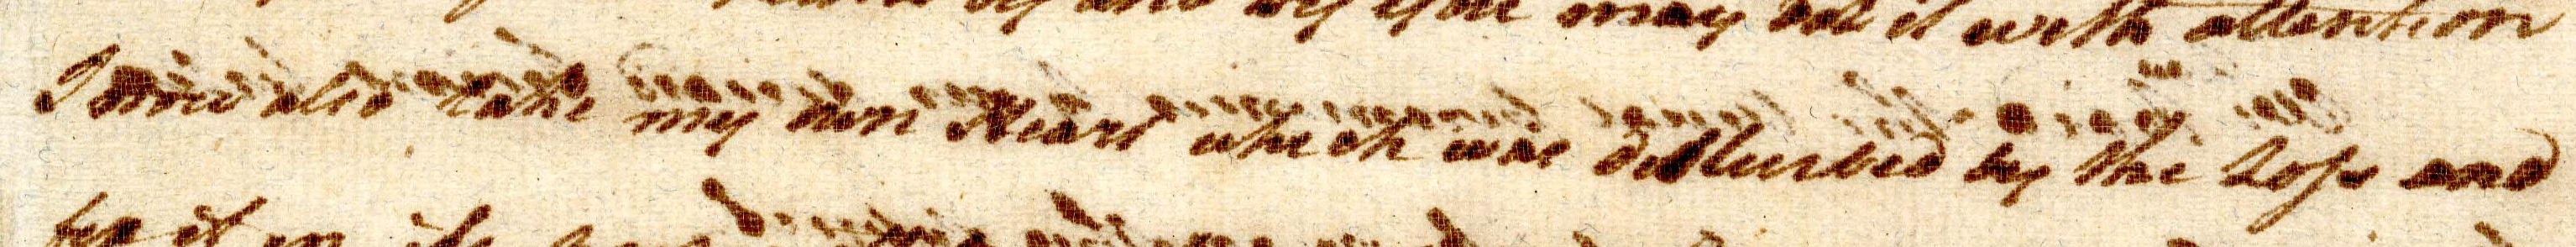I now also take my own Heart which was disturbed by the Loss and
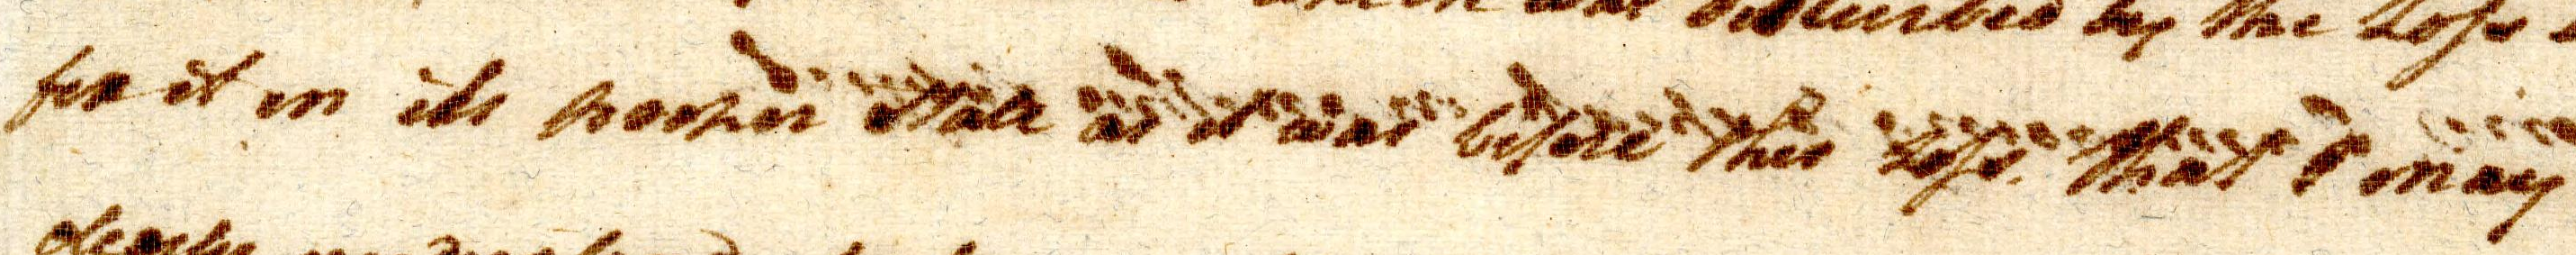fix it in its proper state as it was before this Loss that I may
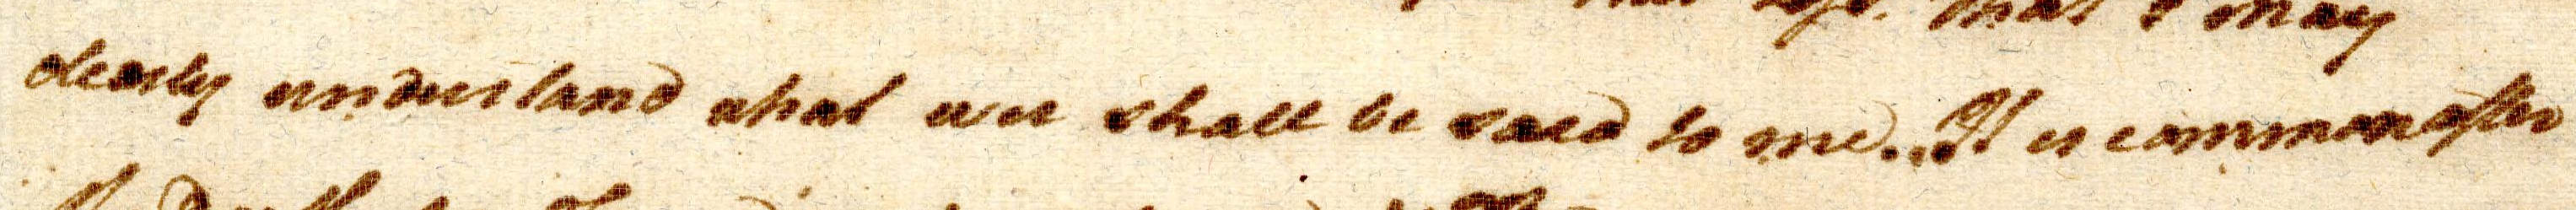clearly understand what ever shall be said to me. It is common after
